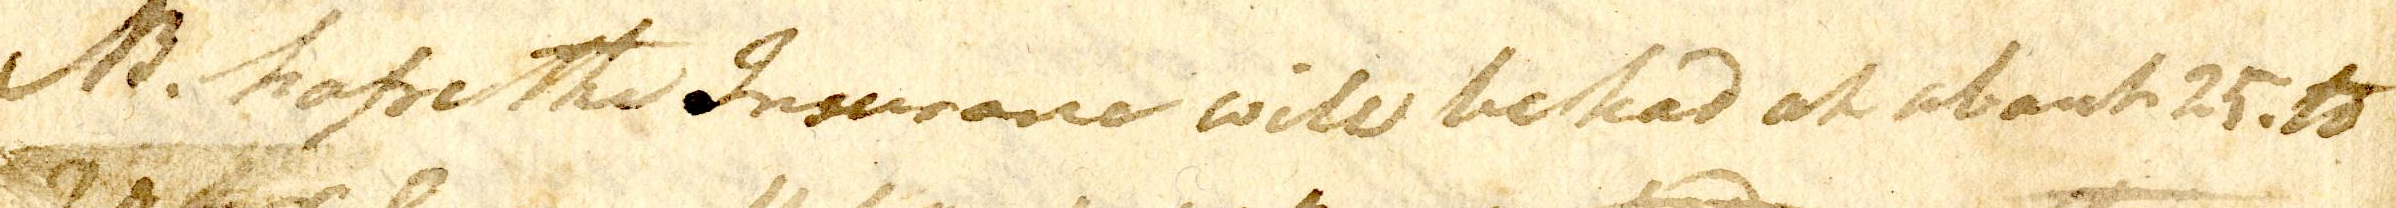NB. hope the Insurane will be had at abut 25. to
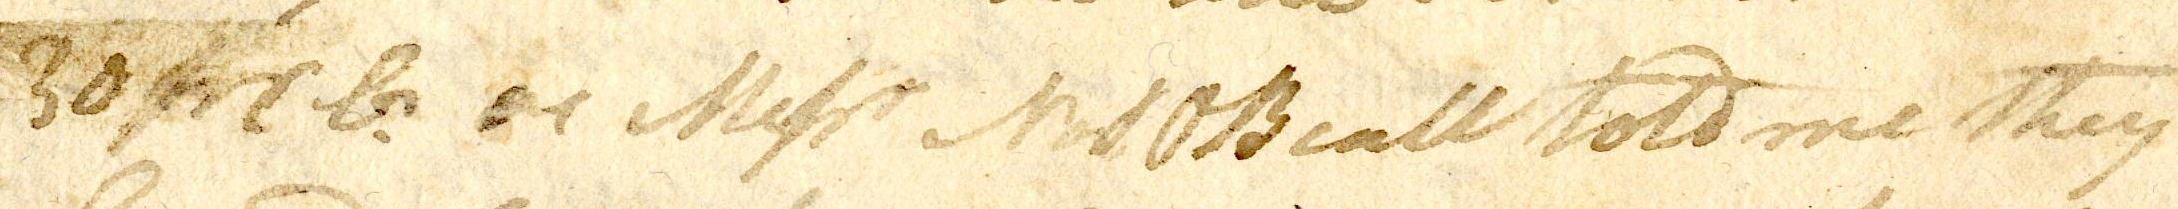30 prC Cr. as Mess^r. Nat & Beall told me they
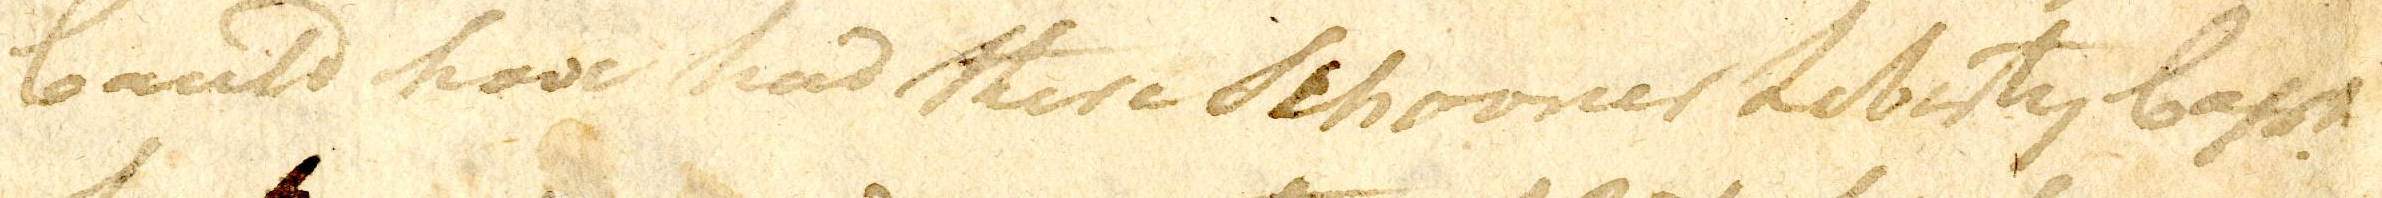Could have had there Schooner Liberty Capt
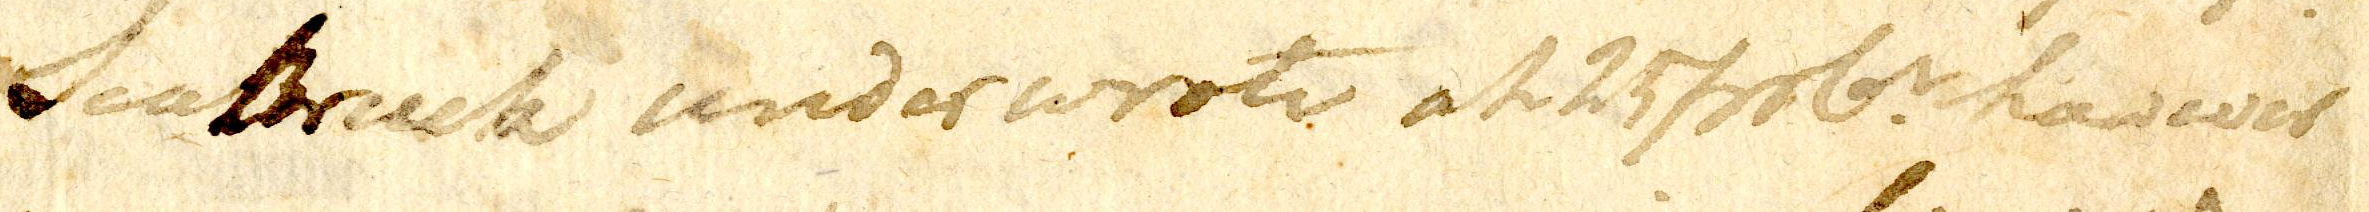Seabruck under wrote at 25 prC^t. C^r. however
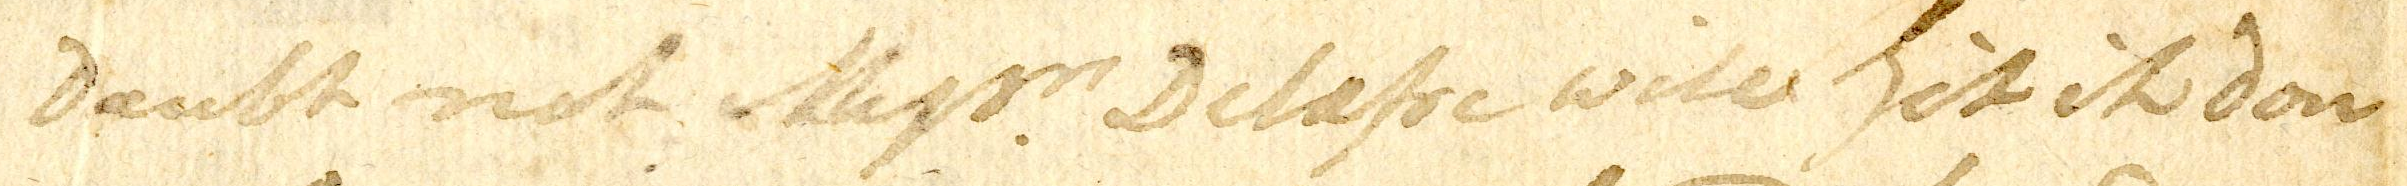Doubt not Mess^r. Delasse will Git it don
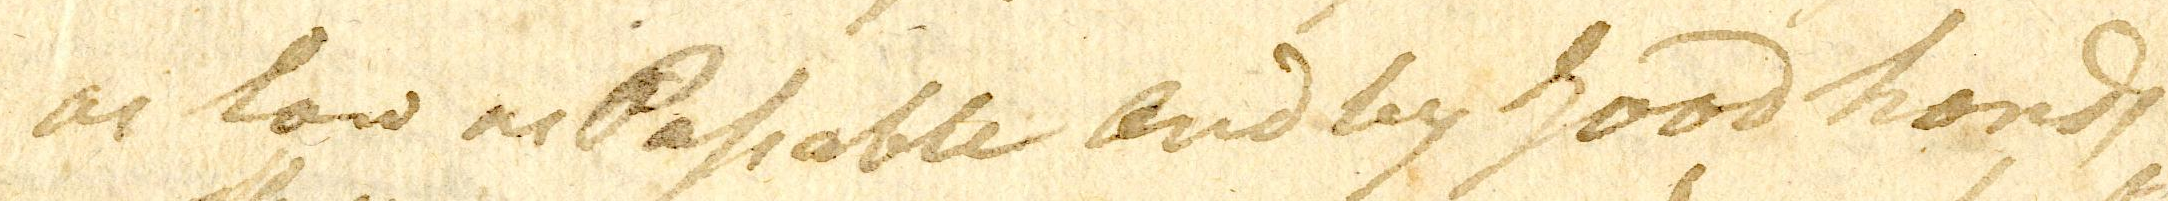as low as Possable and by Good hands
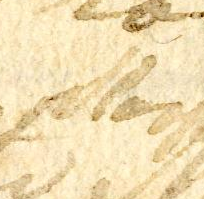Sloop
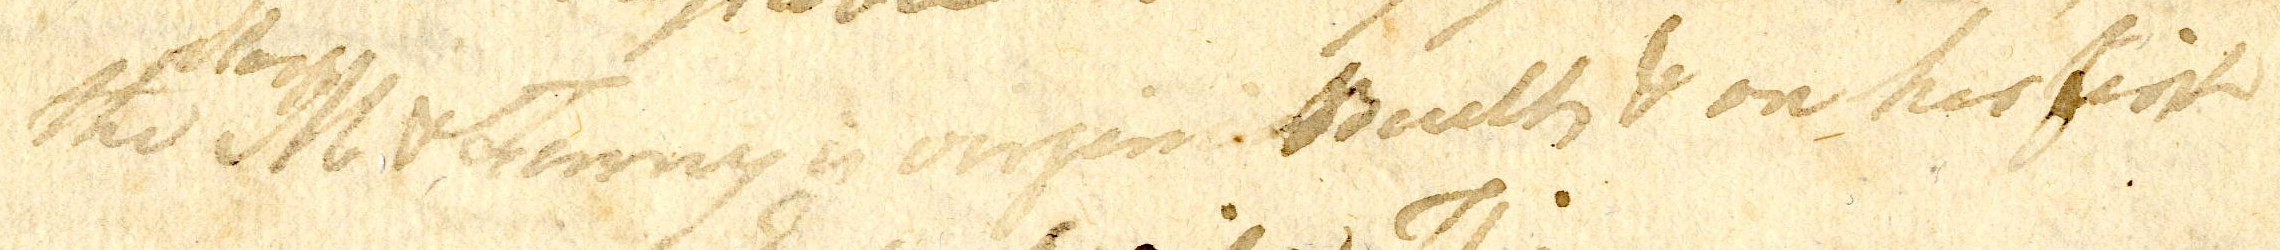the M & Fanny is virgina Built & on her first
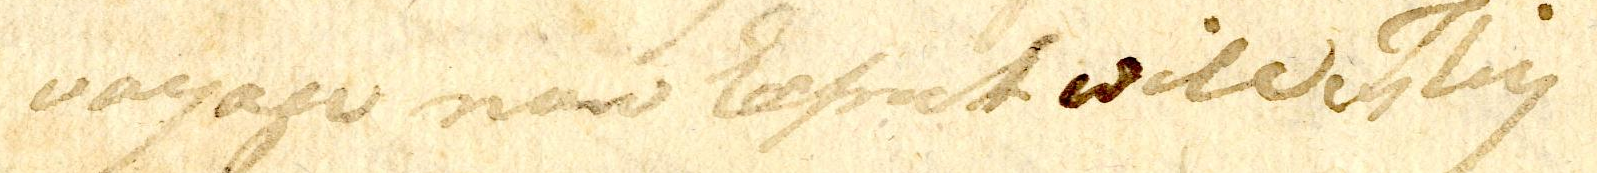voyage now Expect will stay
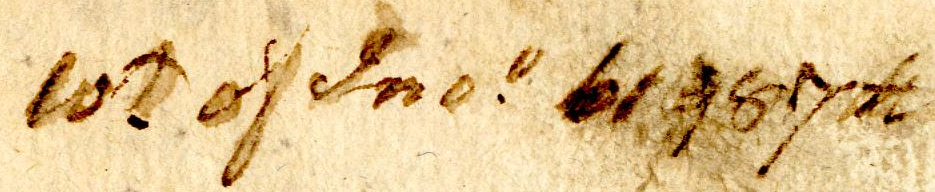lot of Ino^t. 61 187^h
